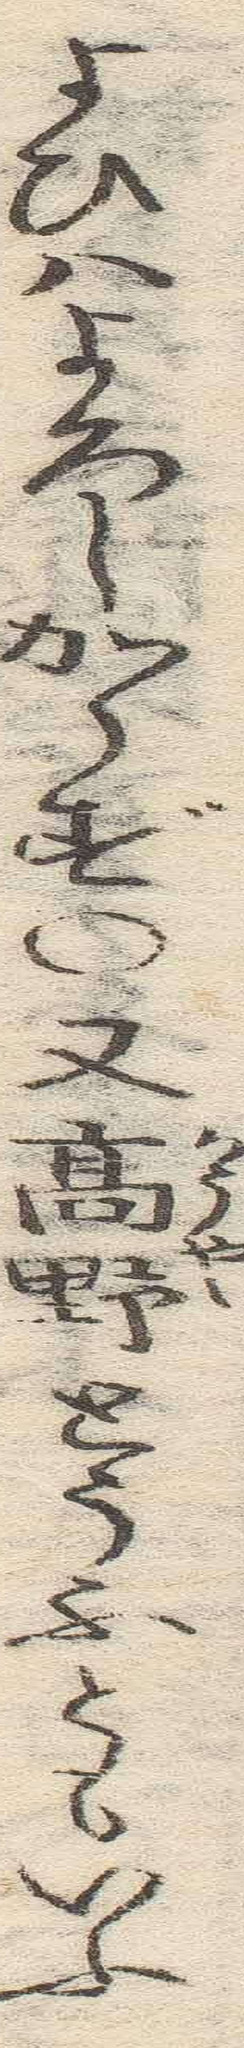よひはよろしからず○又高野とうふともいふ
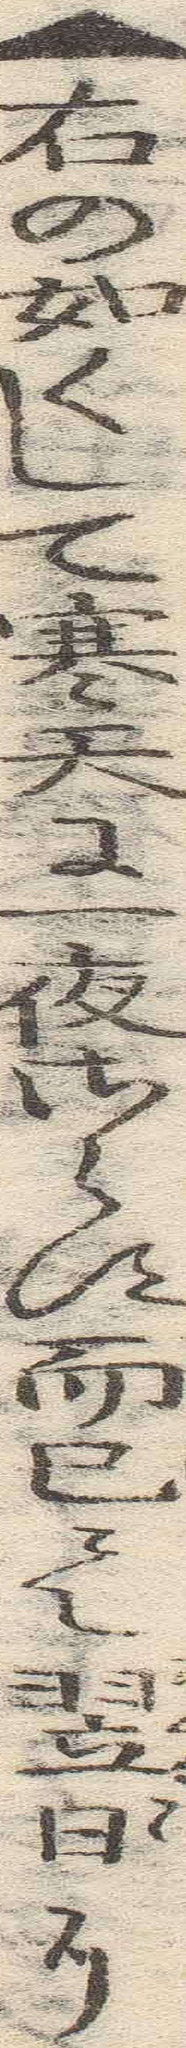▲右の如くして寒天に一夜さらす而已にて翌日に
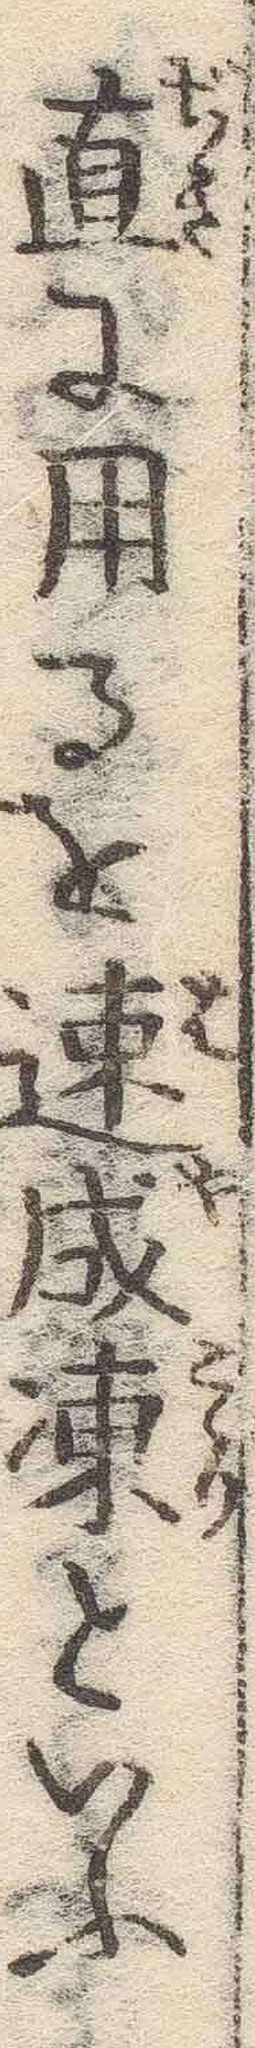直に用るを速成凍といふ
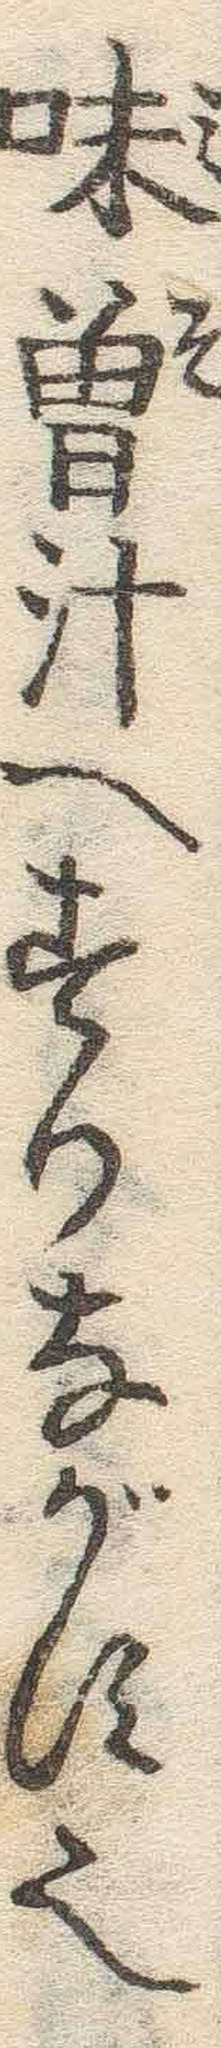味曽汁へすりながす也
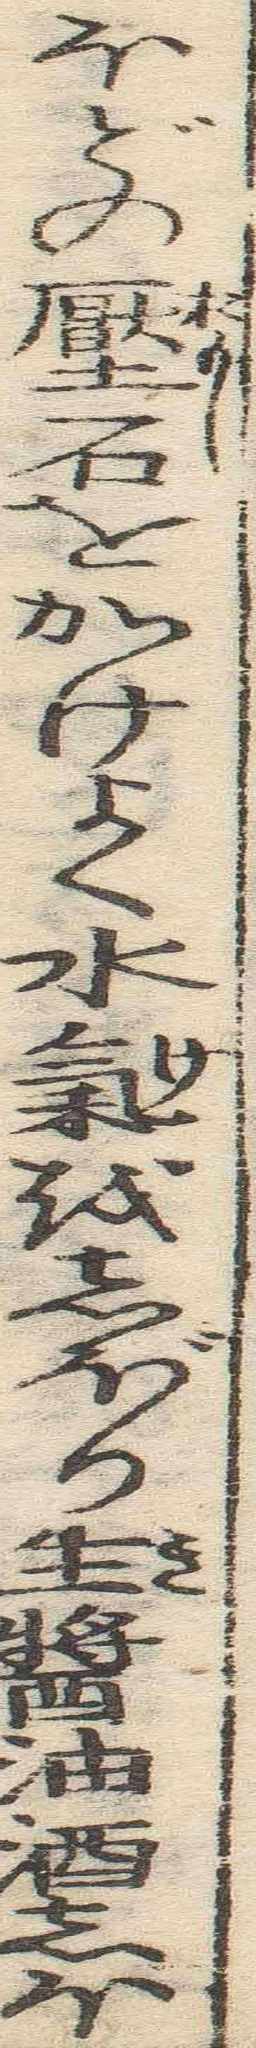ほどの壓石をかけよく水気をしぼり生醤油酒しほ
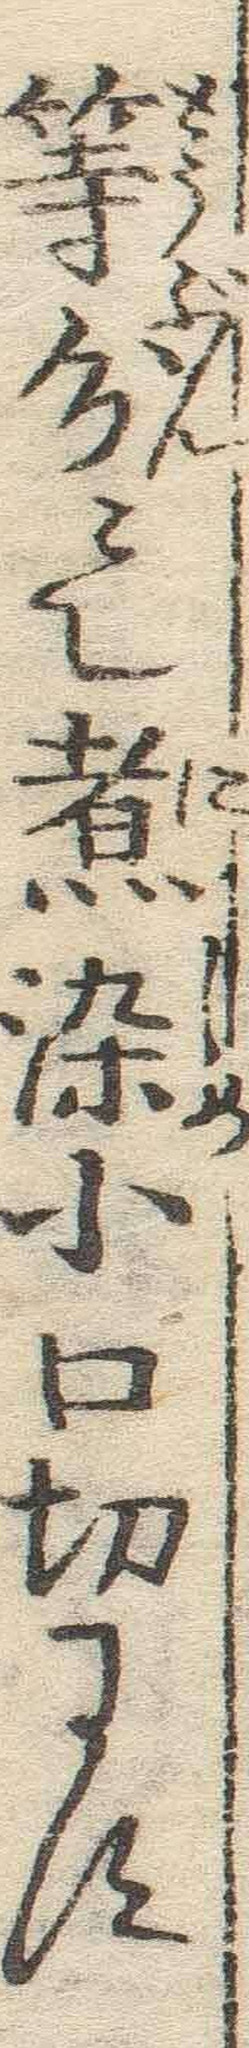等分にて煮染小口切にす

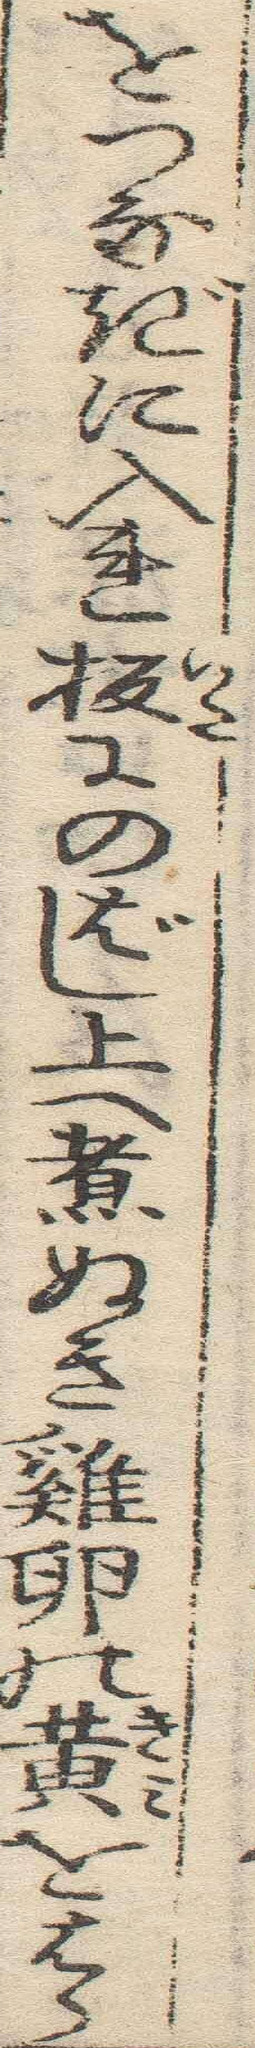をつなぎに入れ板にのばし上へ煮ぬき鶏卵の黄をはら
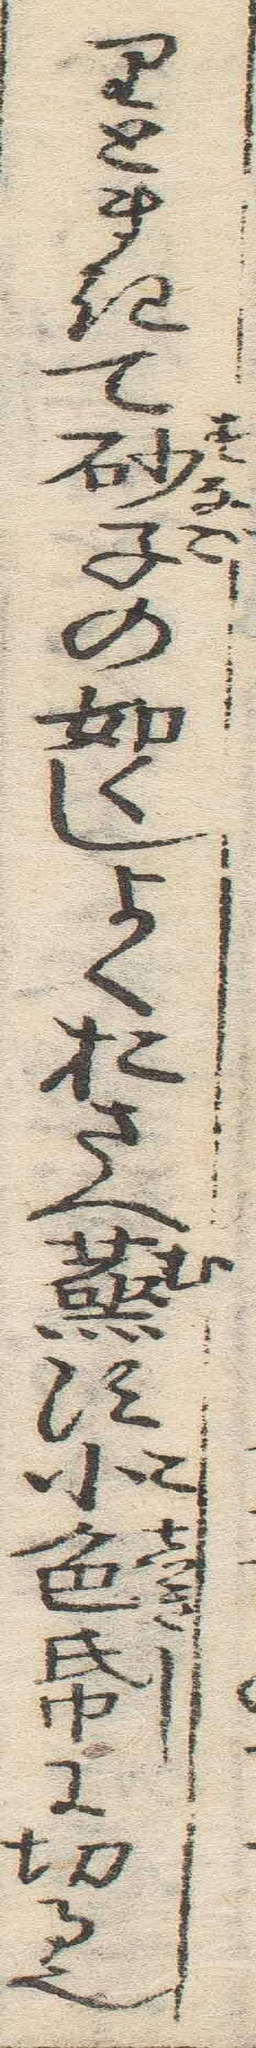りとまきて砂子の如くしよくおさへ蒸す小色紙に切る也
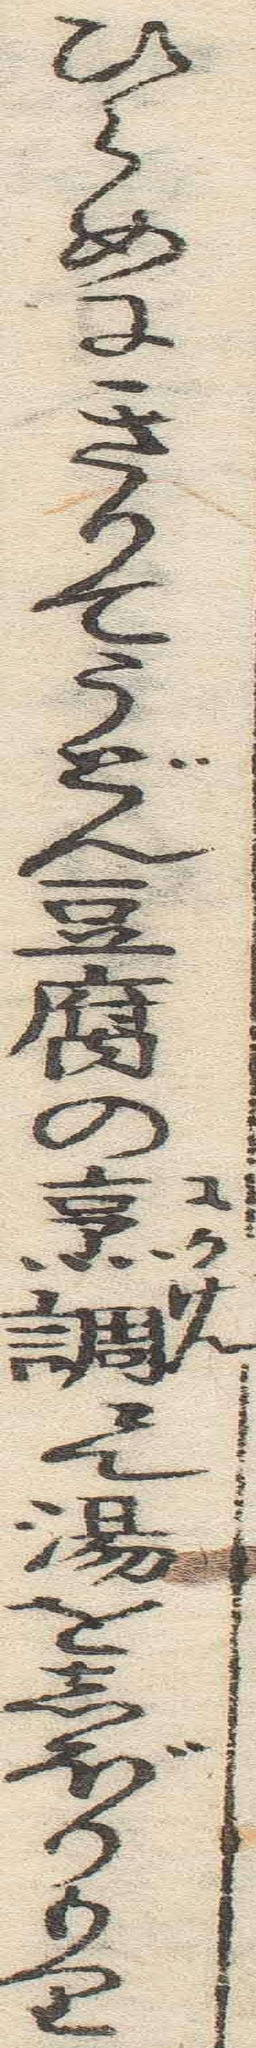ひらめにきりてうどん豆腐の烹調にて湯をしぼりもり
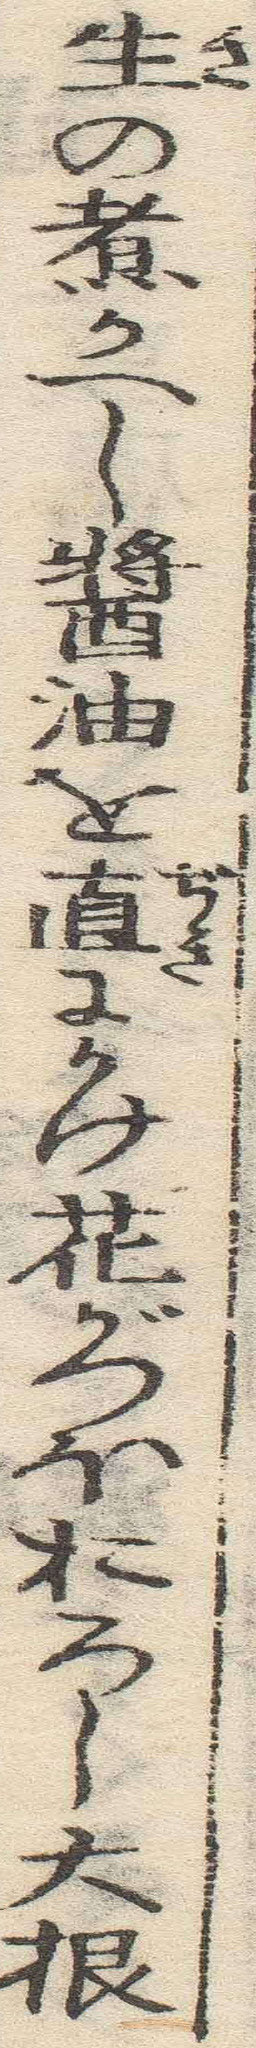生の煮かへし醤油を直にかけ花がつほおろし大根
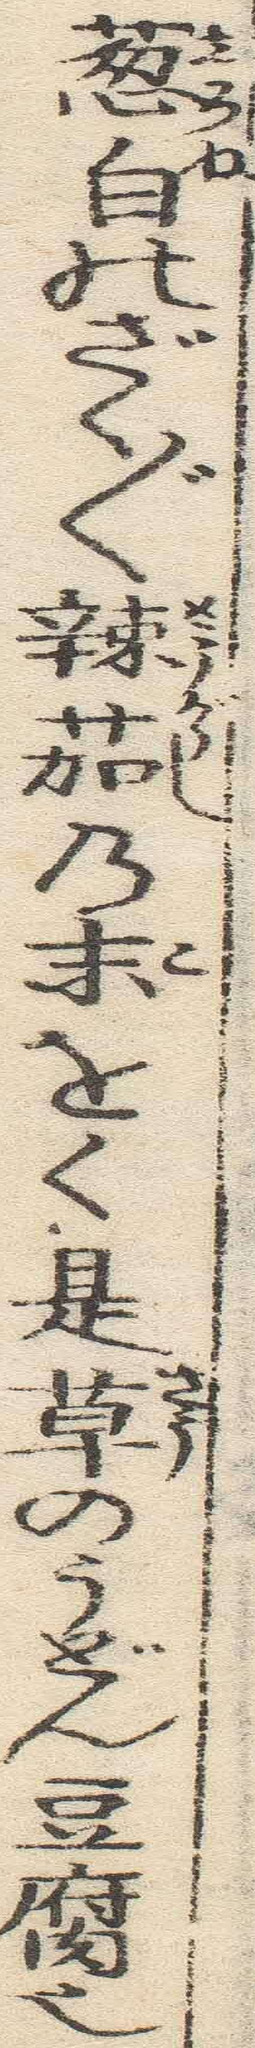葱白のざく〴〵辣茄の末をく是草のうどん豆腐也
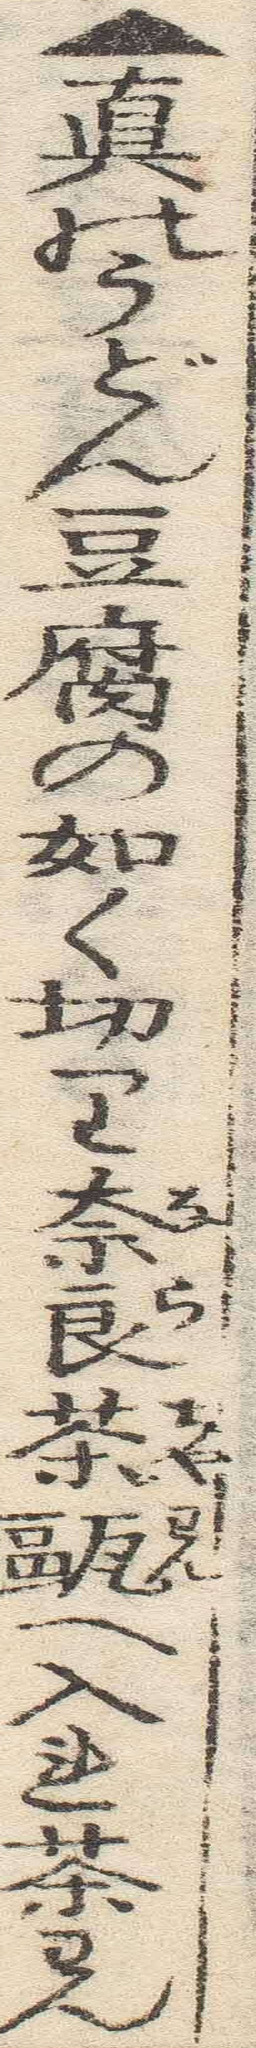▲真のうどん豆腐の如く切り奈良茶甌へ入れ茶わん
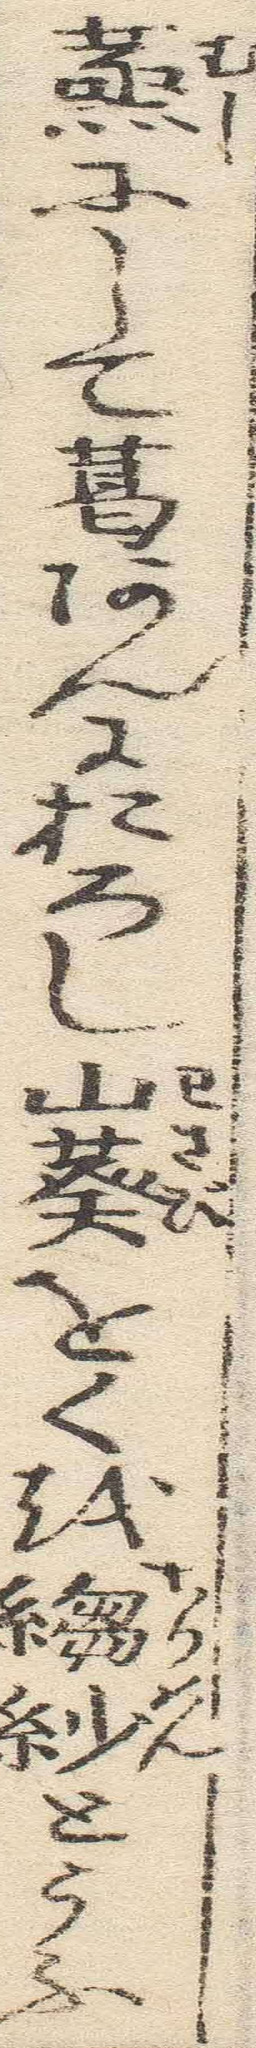蒸にして葛あんにおろし山葵をくを縐紗とうふ
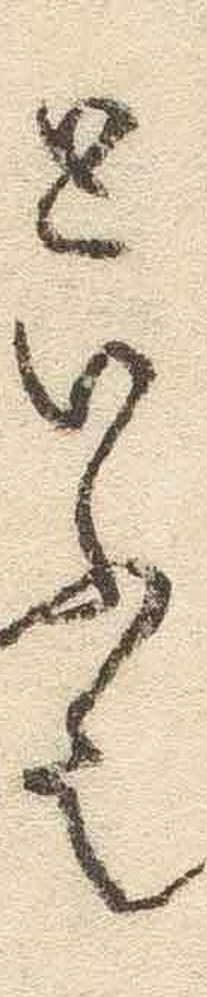といふ也
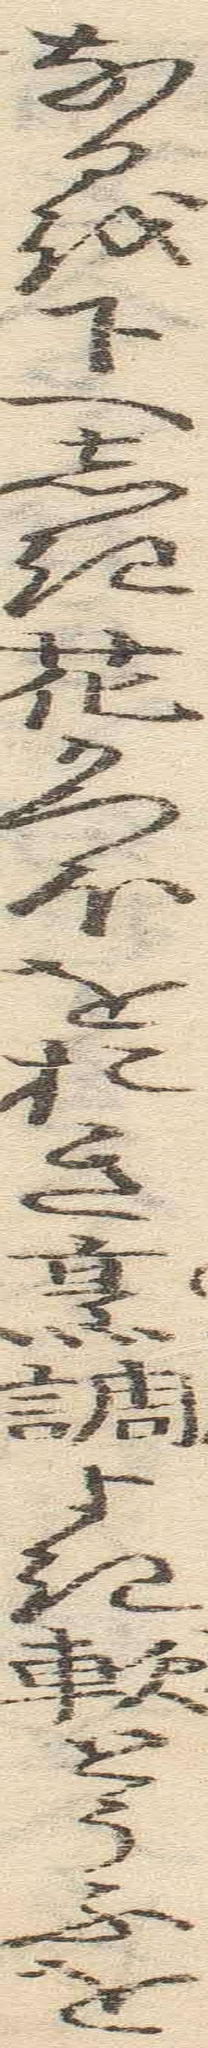なるを下へしき花かつほをおき烹調よき軟とうふを
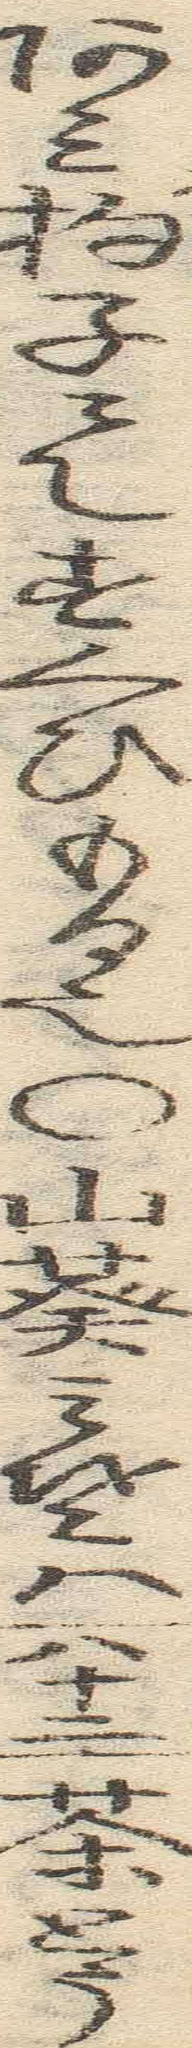あみ杓子にてすくひもる也○山葵みそは[八十二]茶とう
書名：豆腐百珍
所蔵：東京学芸大学附属図書館 国文学研究資料館
